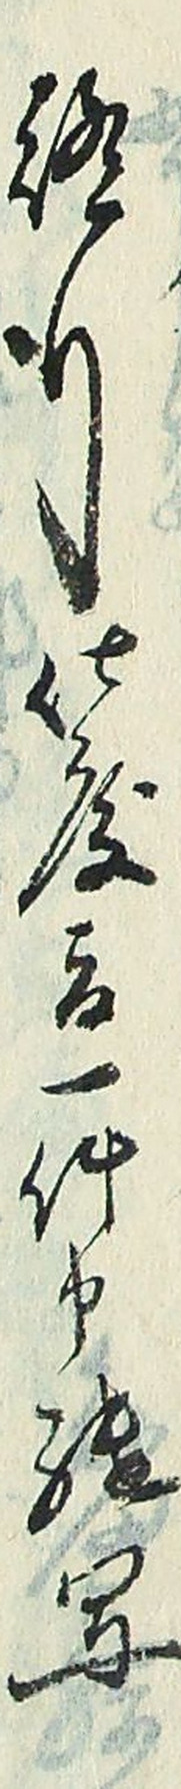修行仕度旨一件申継写
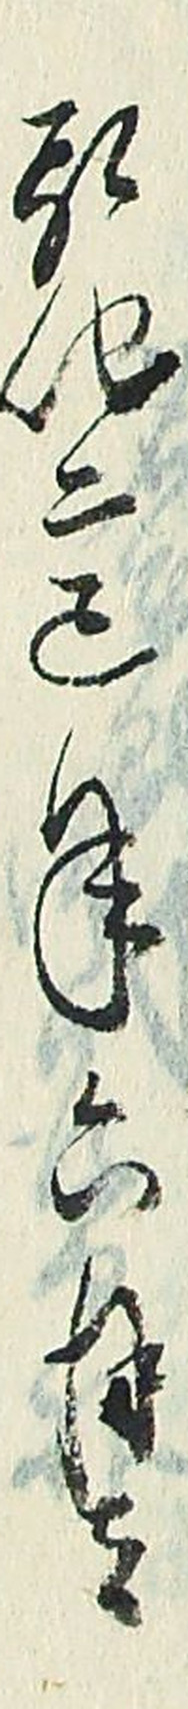弘化二巳年六月七日

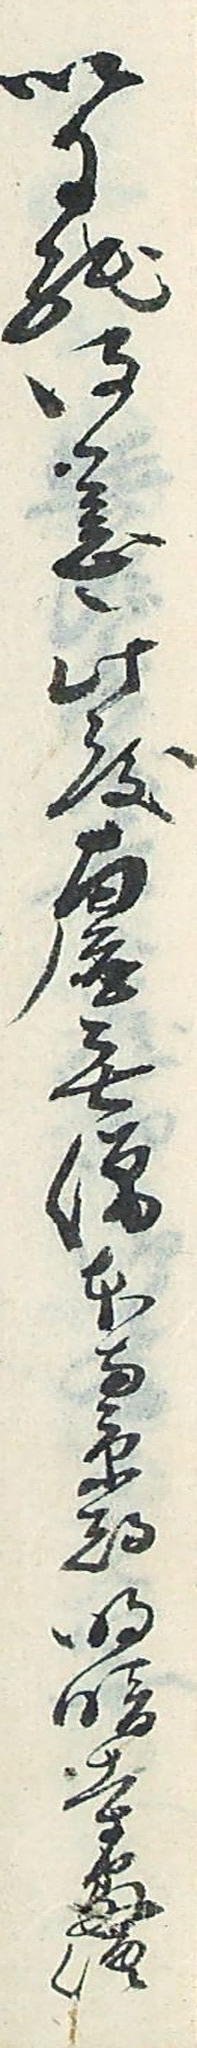以手紙得御意候此度虚無僧本寺京都明暗寺番僧
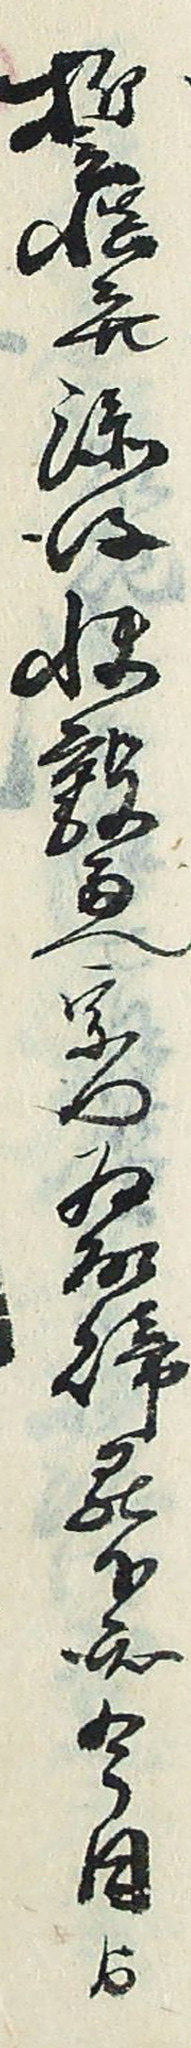誓慎幷添役快毅両人宗門為取締罷下候所今月ゟ
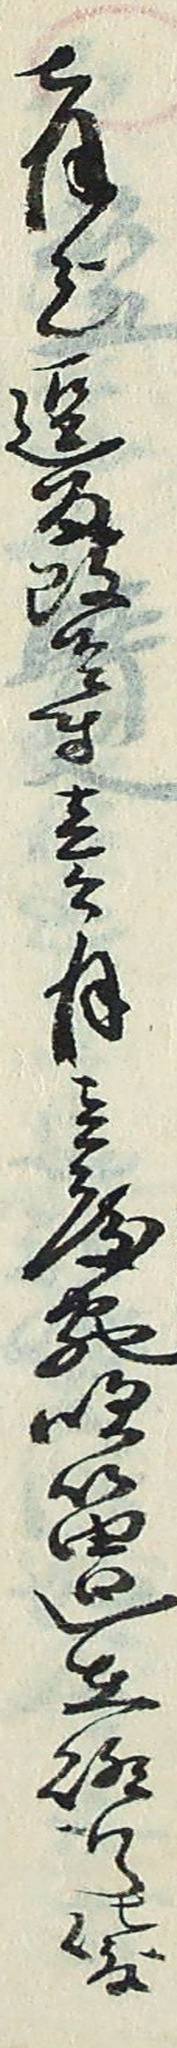七月迄逗留改候ニ付壱ケ月壱度宛吹笛廻在修行仕度
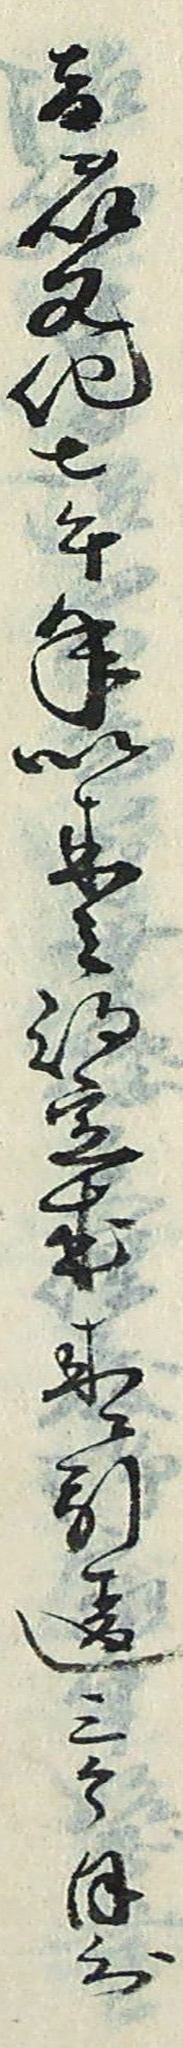旨ヲ以文化七午年以来之約定成来ニ引違三ケ月分
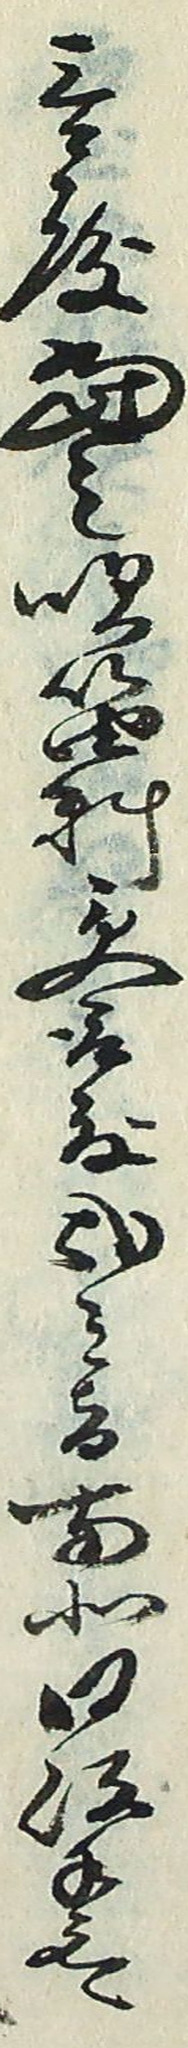三ケ度當之吹笛料受取度哉之旨南北同役手元へ
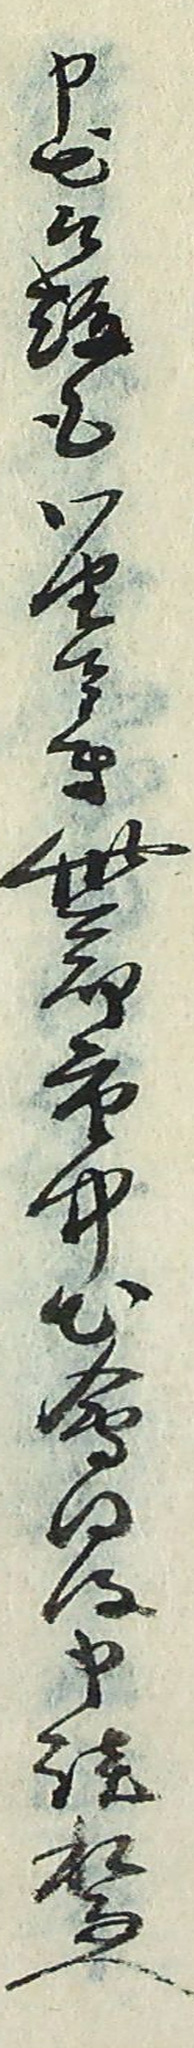申出候趣も御坐候ニ付此節市中出會同役申談私両人
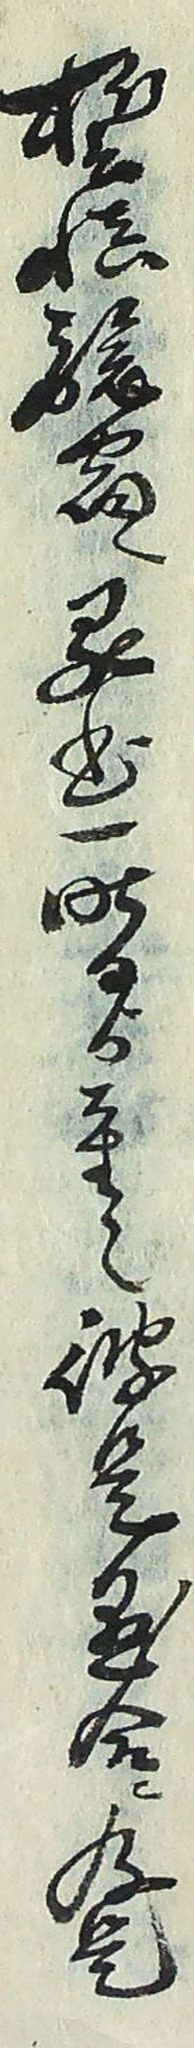誓慎旅宿へ罷出一昨日ゟ重々彼是懸合ニ及是
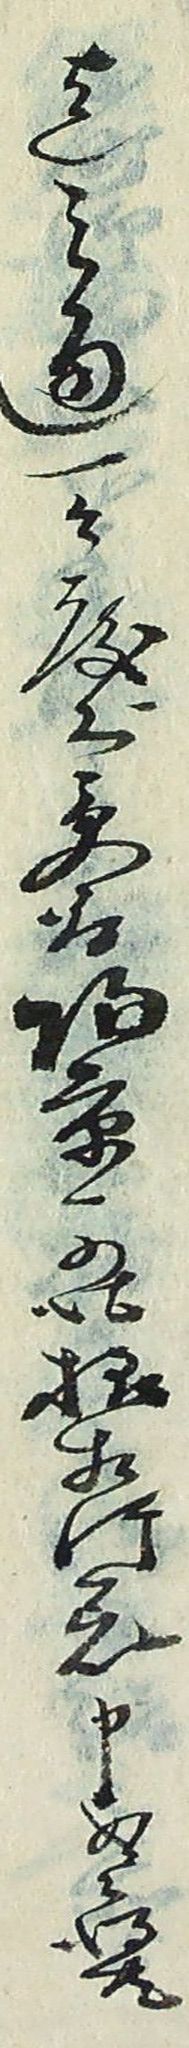迄之通一ケ度分受取帰京可仕様相行着申義ニ候得共
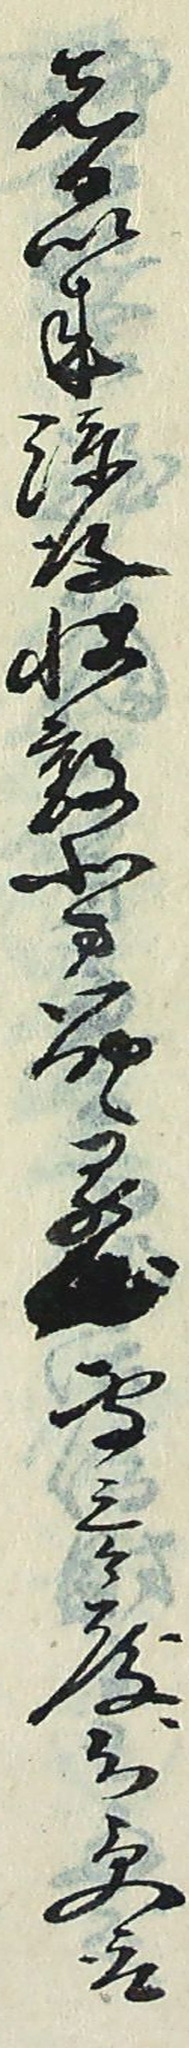先日以来添役快毅北方筋へ罷出處三ケ度分受取
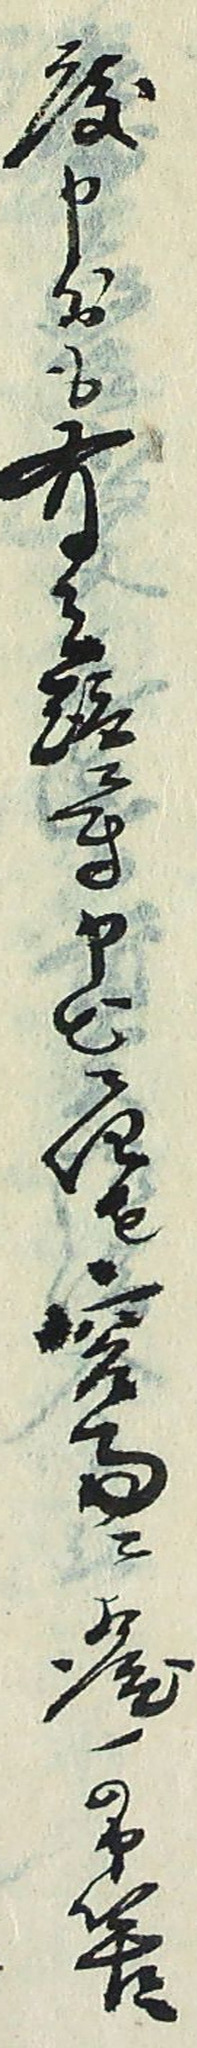度申分も有之趣ニ付申出ニ任せ容易ニ相渡可申筈
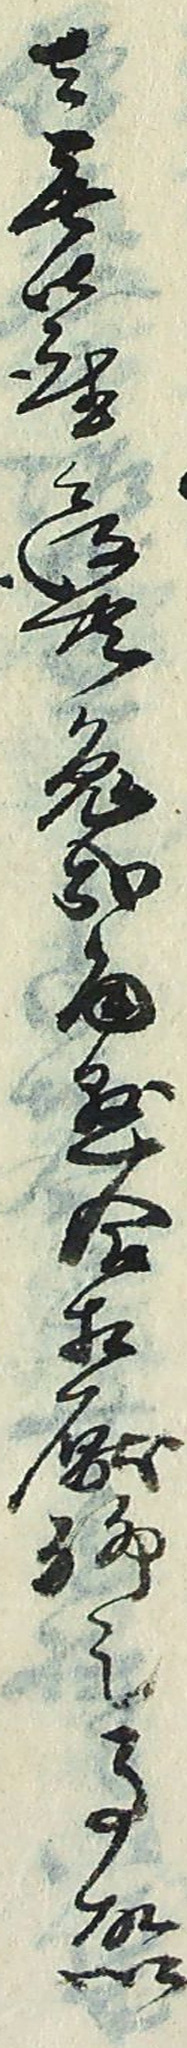者無御座候得共兎哉角懸合相厭聊之事故い
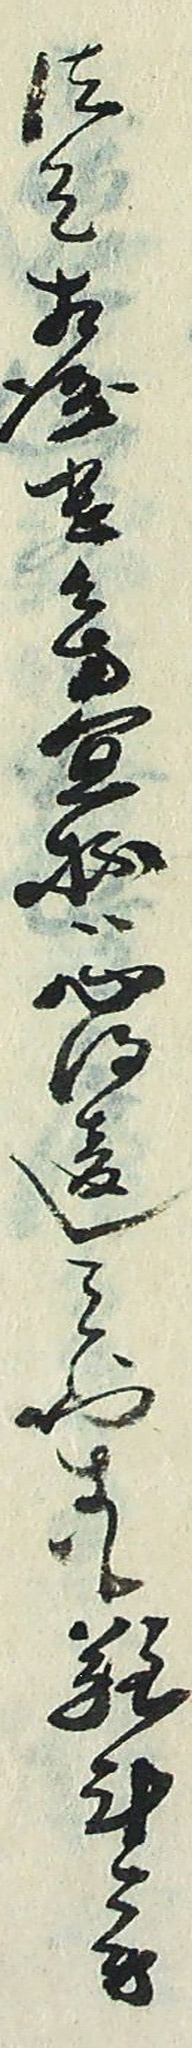つそ相渡遣候方宜抔御心得違之村方も難計ニ付
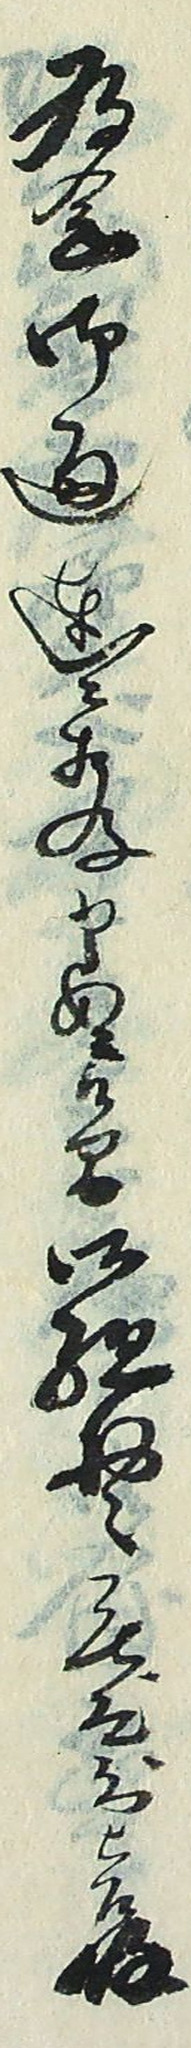為念御通達ニ相及申義ニ候間御組村々庄屋分被召呼
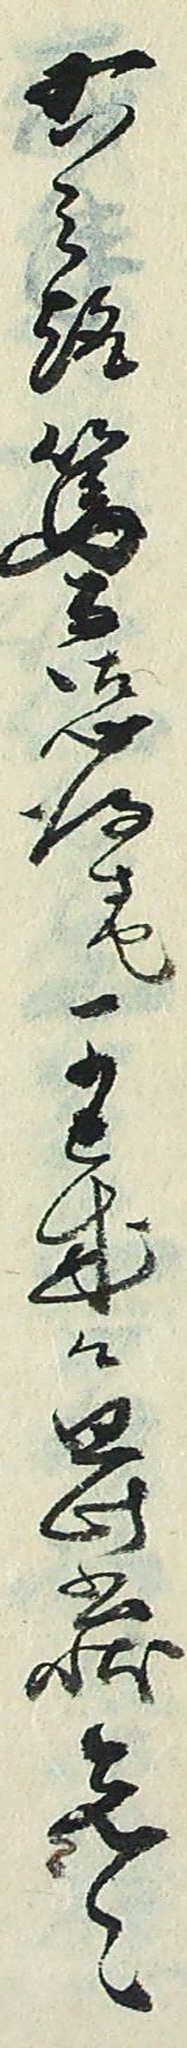右之趣篤と御心得させ可被成候且此書状先々
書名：諸御趣意書并御下知向之写
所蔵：鳴門教育大学 Naruto University of Education
